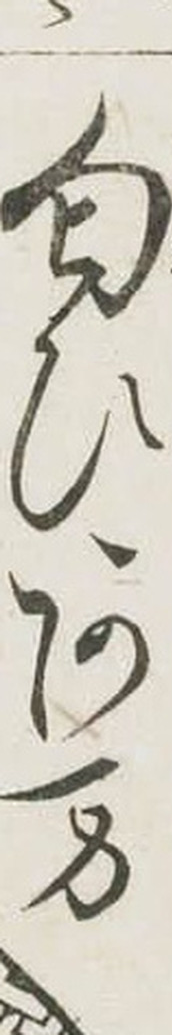匂ひあま
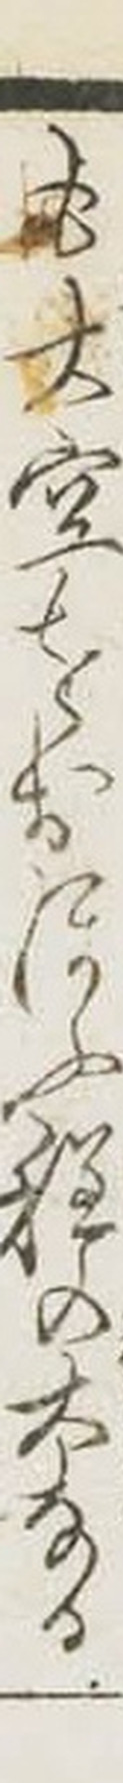も大空をおほふ程の大なる
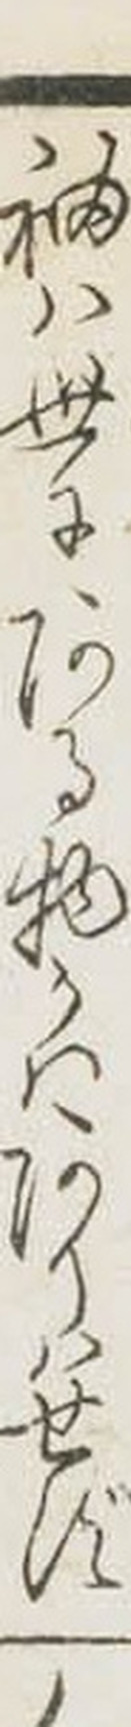袖は世にある物かはありはせず
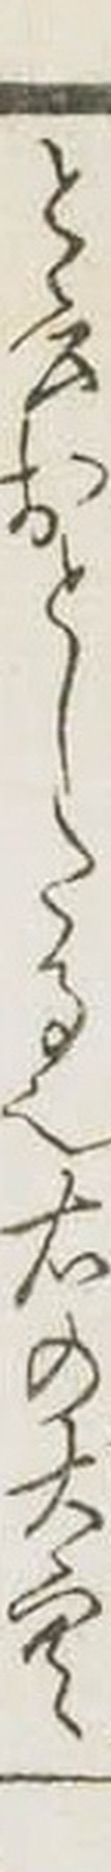と云おとしたる也右の大空
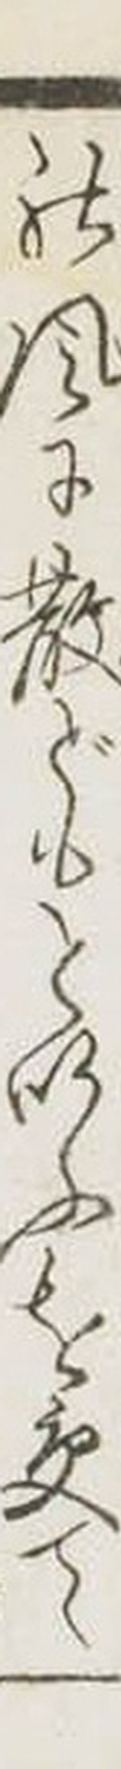の風に散どもといふを受て
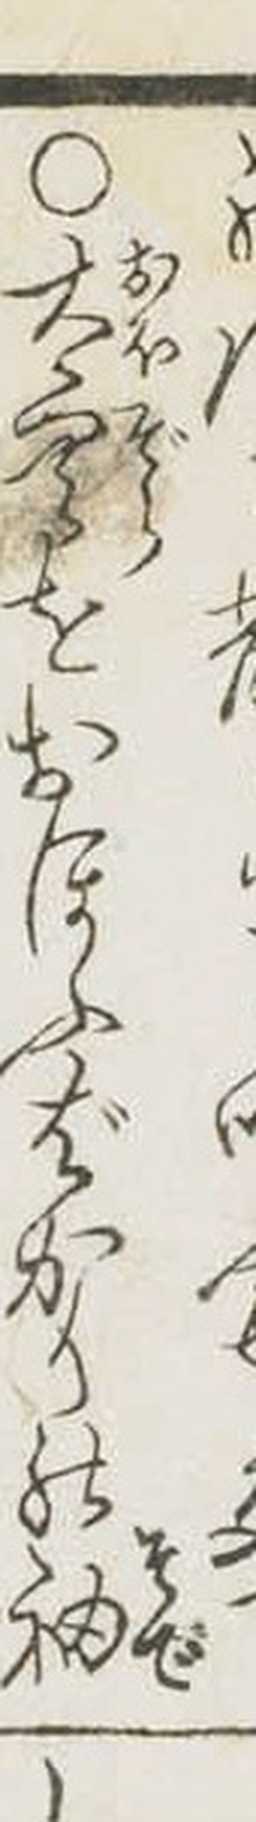○大空をおほふばかりの袖
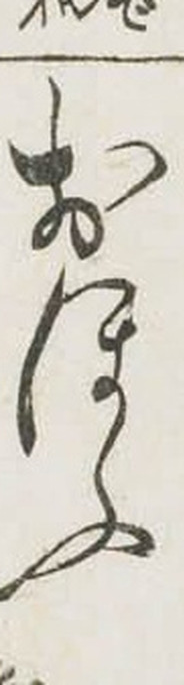おほふ
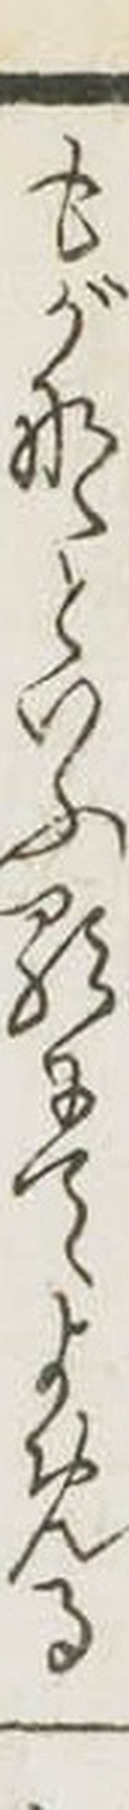もがなといふ歌にてよめる
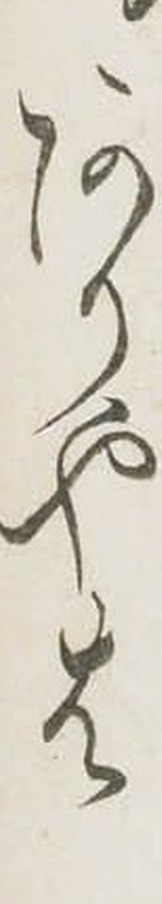ありやは
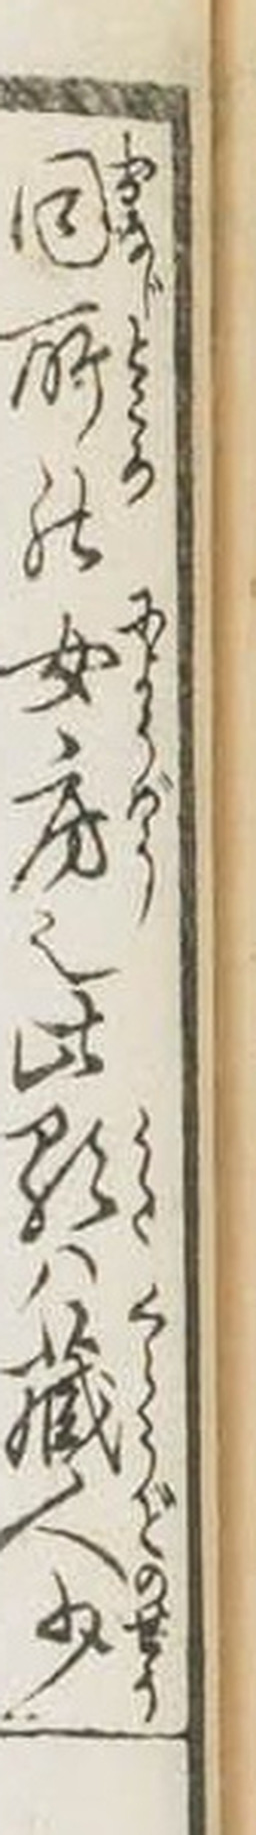同所の女房也此歌は蔵人少
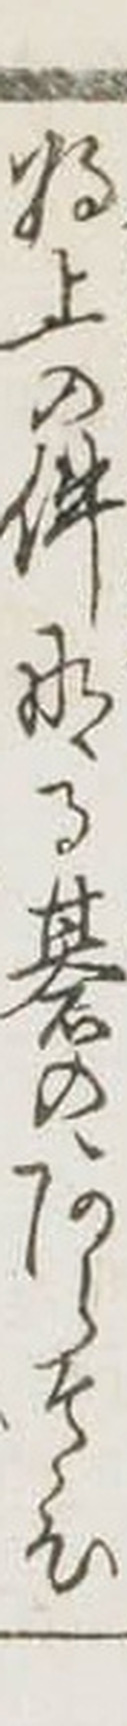将上の件なる碁のあらそひ
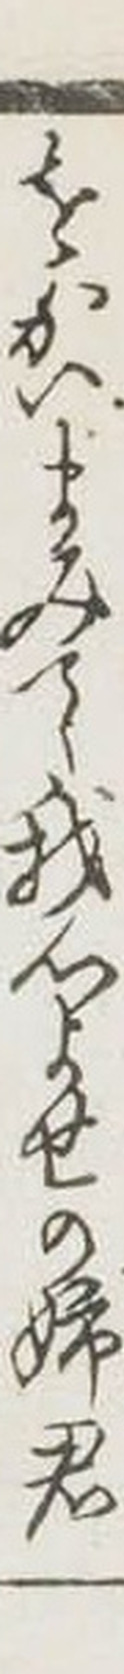をかいまみて我心よせの姉君
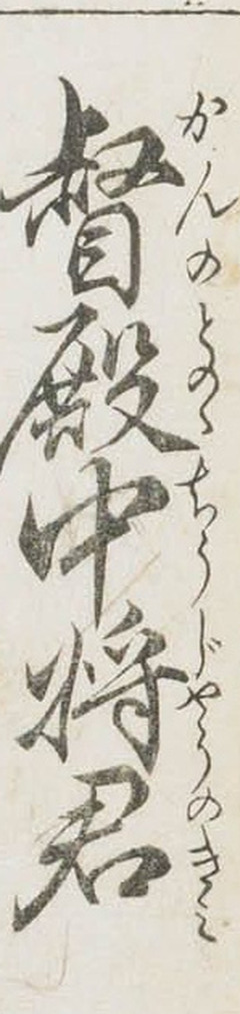督殿中将君
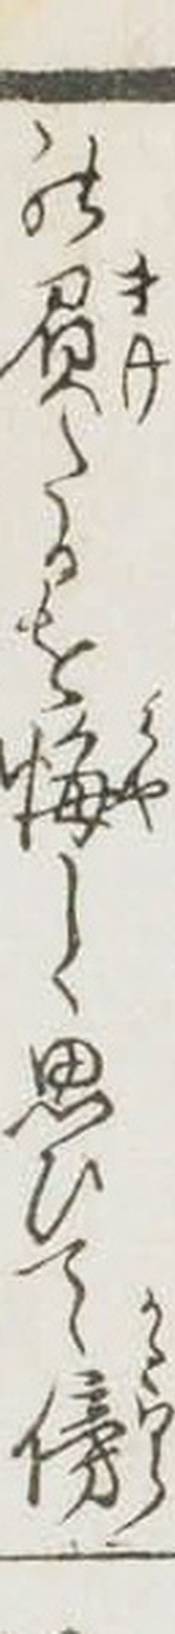の負たるを悔しく思ひて傍
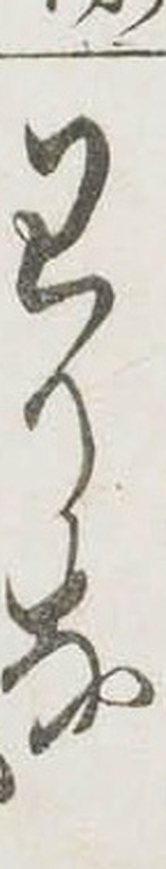わりな
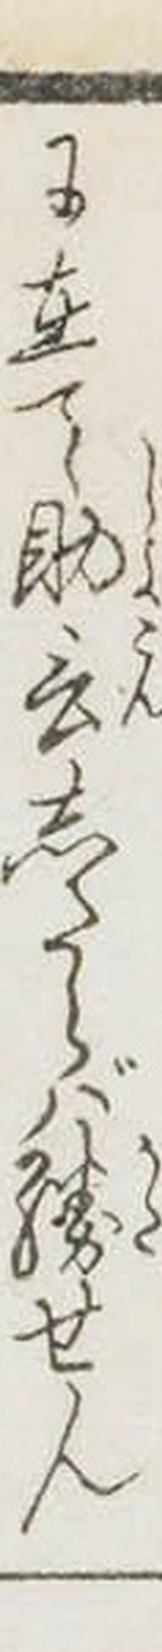に在て助言したらば勝せん
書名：源氏百人一首
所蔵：東京学芸大学教育コンテンツアーカイブ
